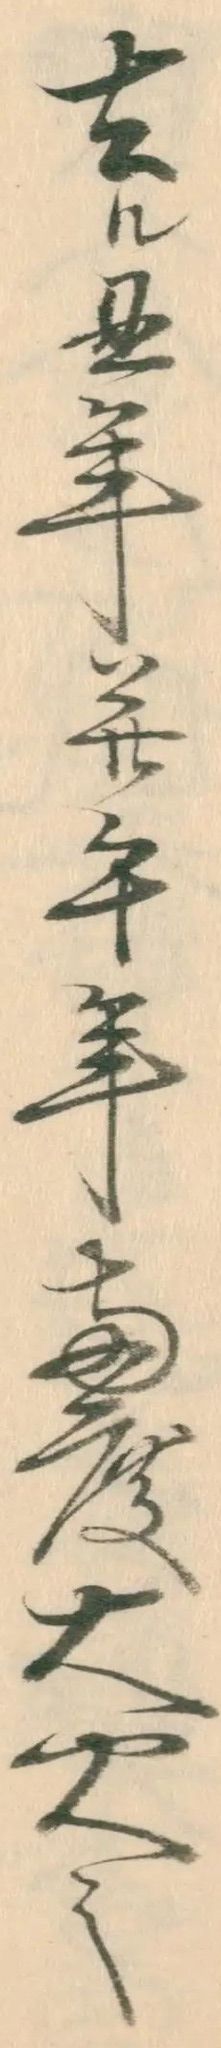去ル丑年并午年両度大火之
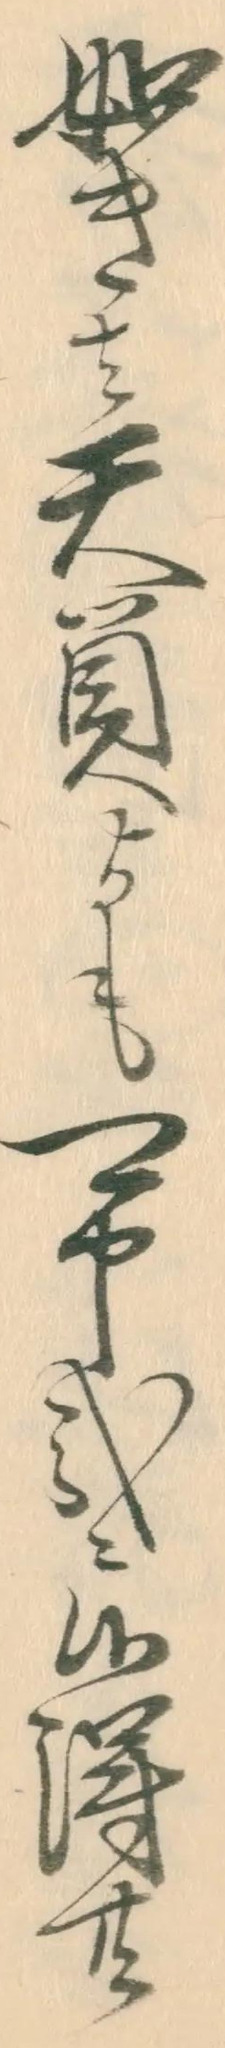如キは天災とも可申哉ニ候得共
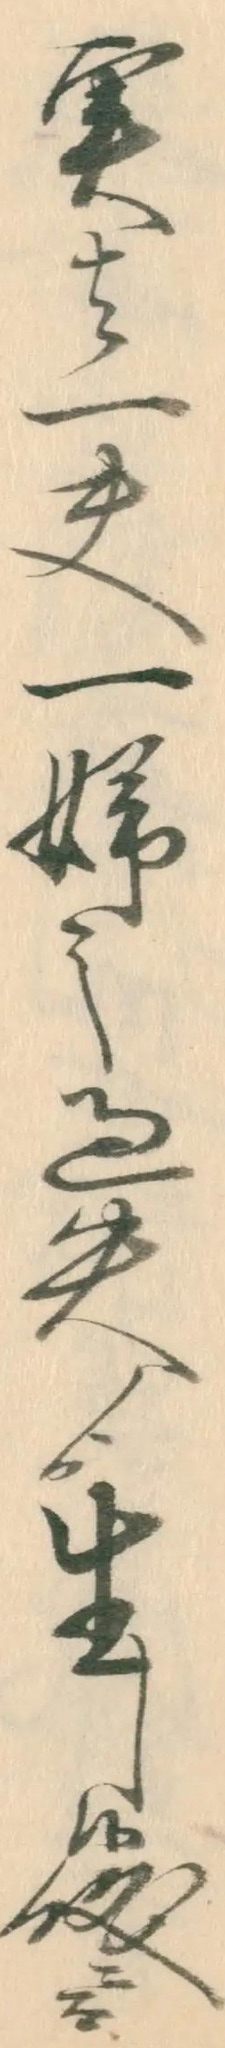実は一夫一婦之過失ゟ生し候儀ニ而
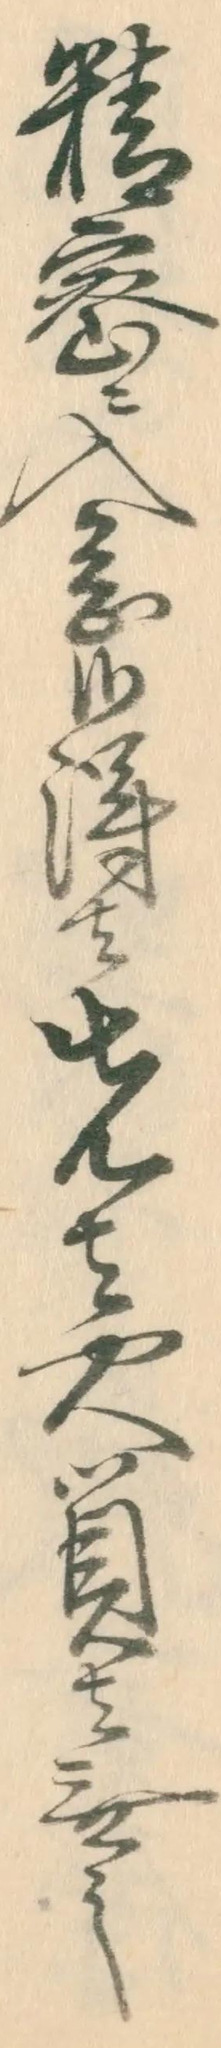精密ニ入念候得は先は火災は無之
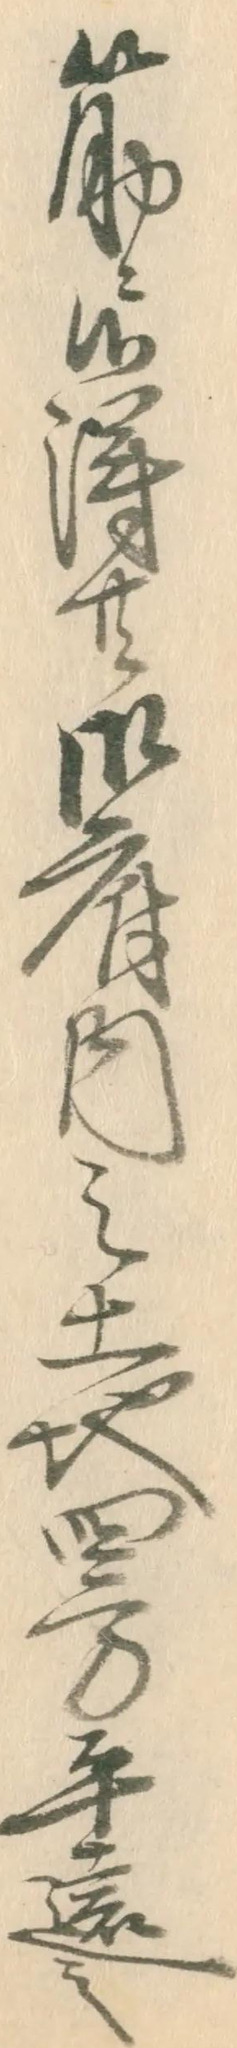筋ニ候得共御府内之土地四方平遠之
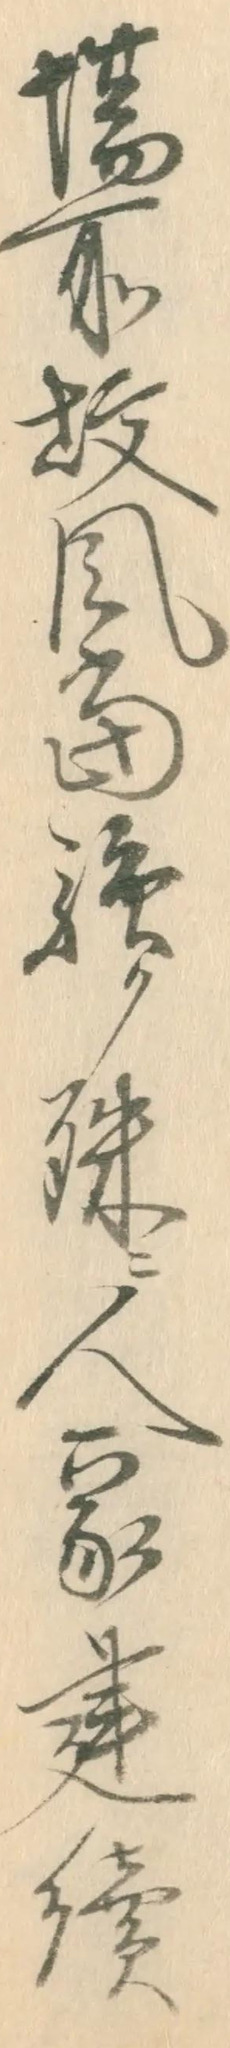場所故風当強ク殊ニ人家建続

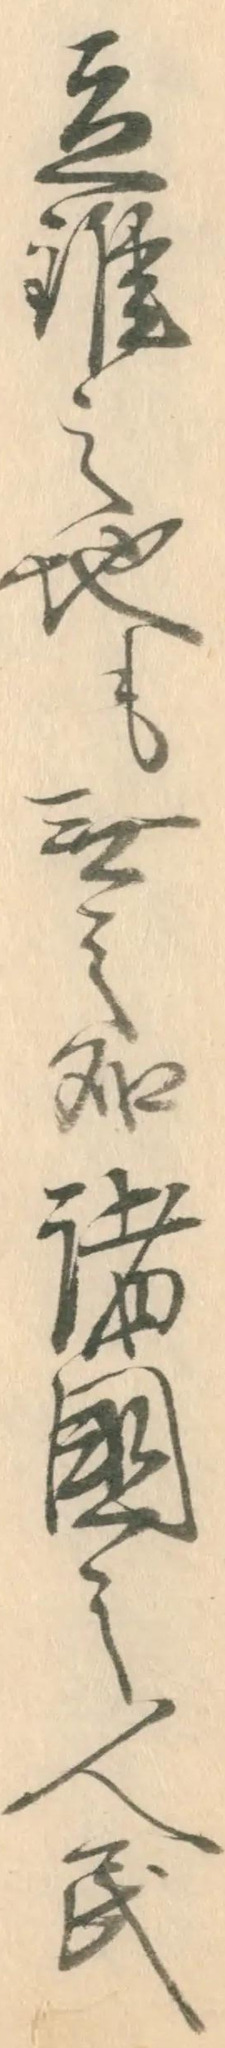立錐之地も無之処諸国之人民
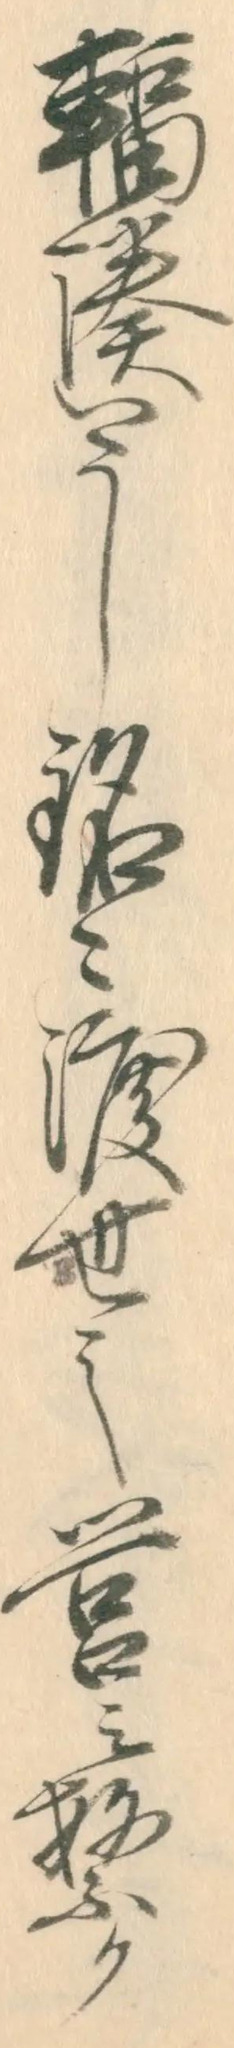輻湊いたし銘々渡世之営ミ繁ク
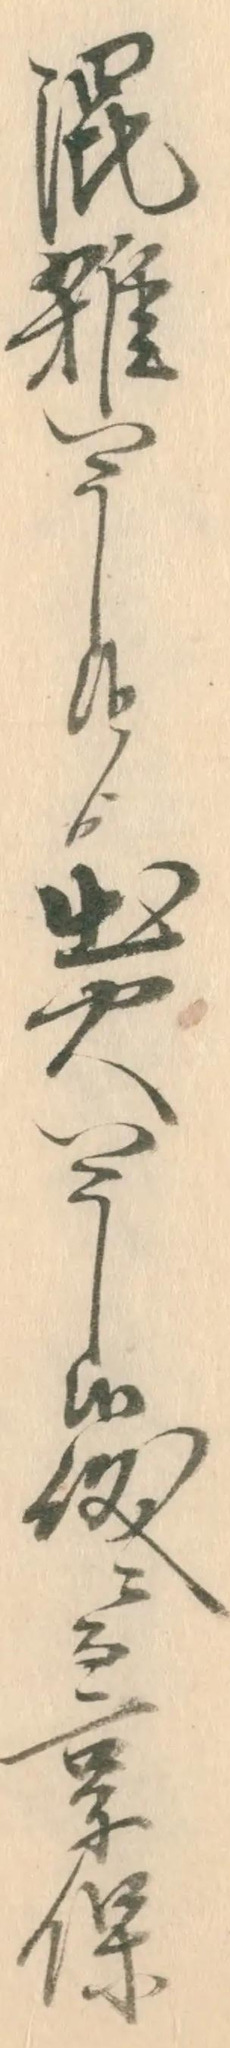混雑いたし候ゟ出火いたし候儀ニ而享保
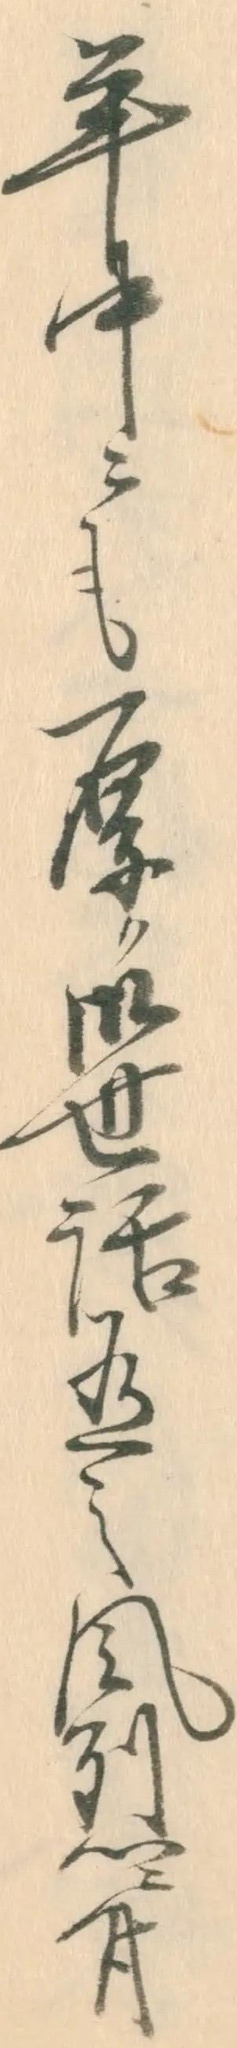年中ニも厚ク御世話有之風烈ニ付
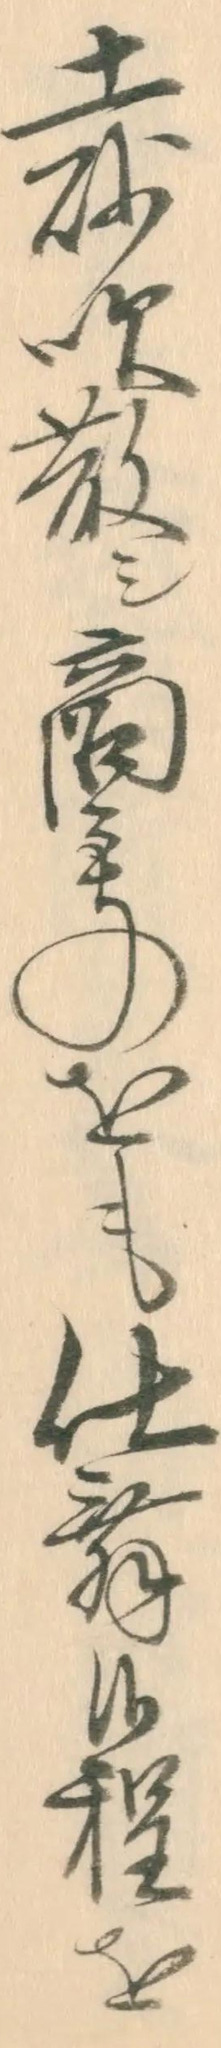土砂吹散シ商ものをも仕舞候程を
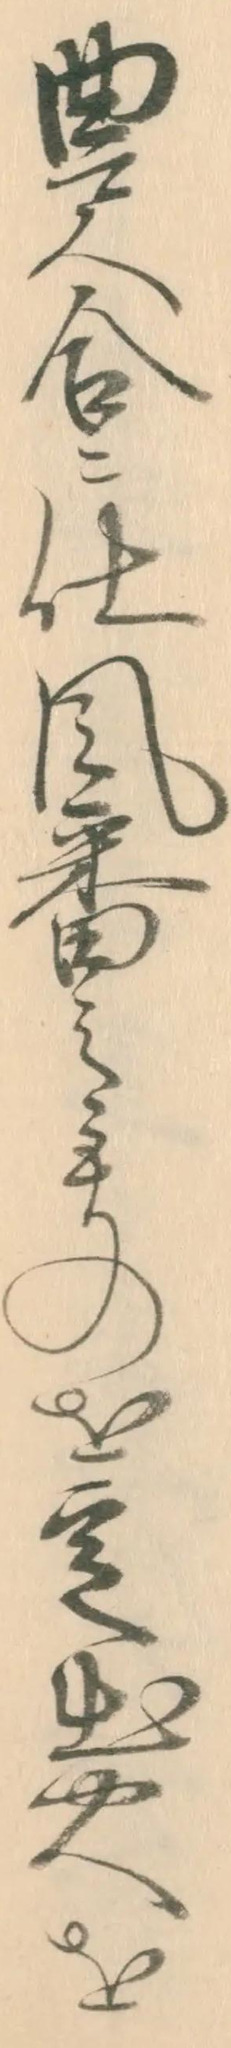曲尺合ニ仕風番之ものを定出火を
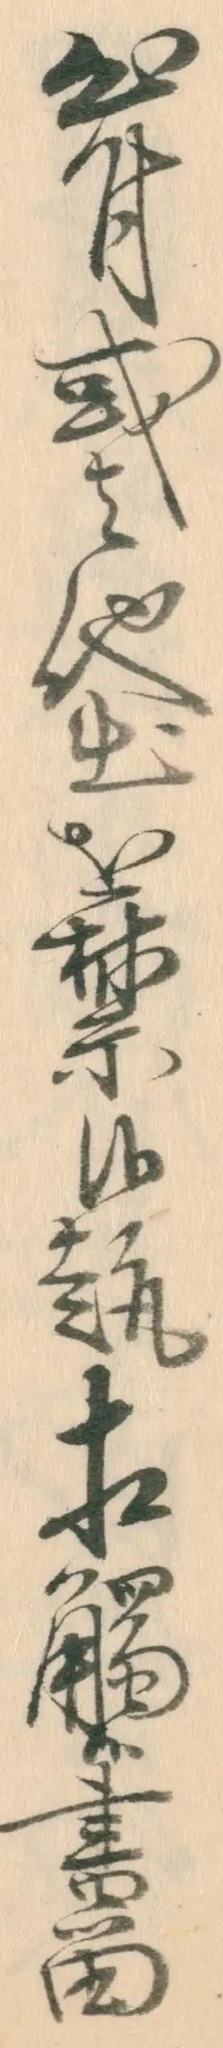心付或は他出を禁候趣相触候書留
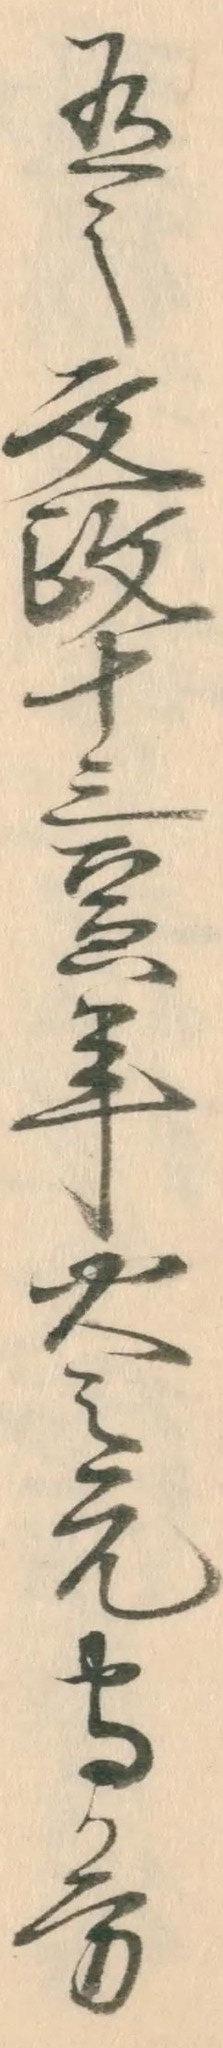有之文政十三寅年火之元守り方
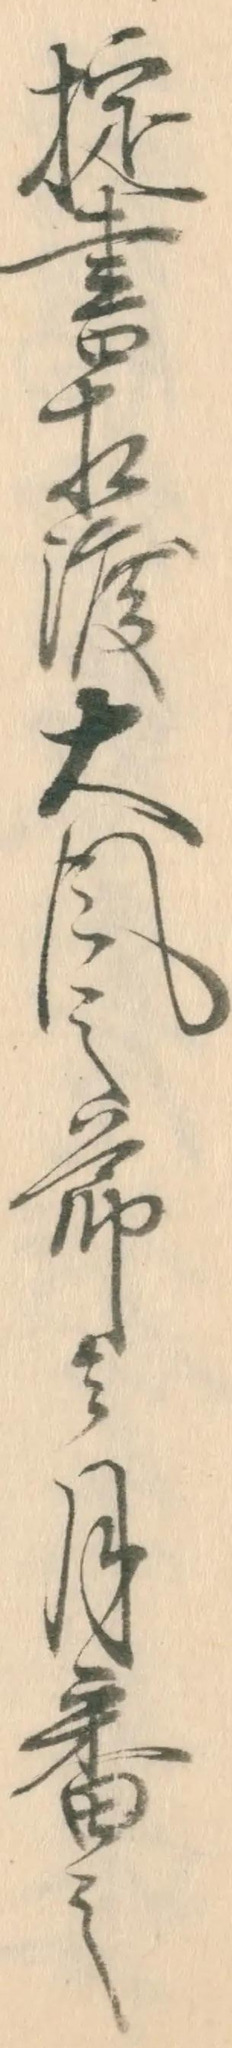掟書相渡大風之節は月番之
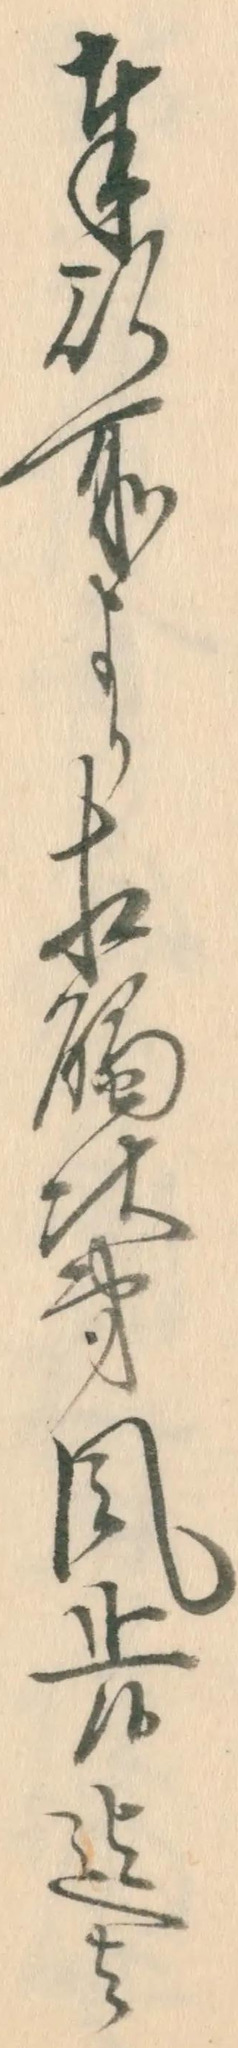奉行所より相触次第風止候迄は
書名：三橋 17巻. [7] 三橋小破御修復書留　但御奉行御掛リ替地震潰橋番屋　嘉永四亥年より安政二卯年迄　上
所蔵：国立国会図書館 National Diet Library, JAPAN
